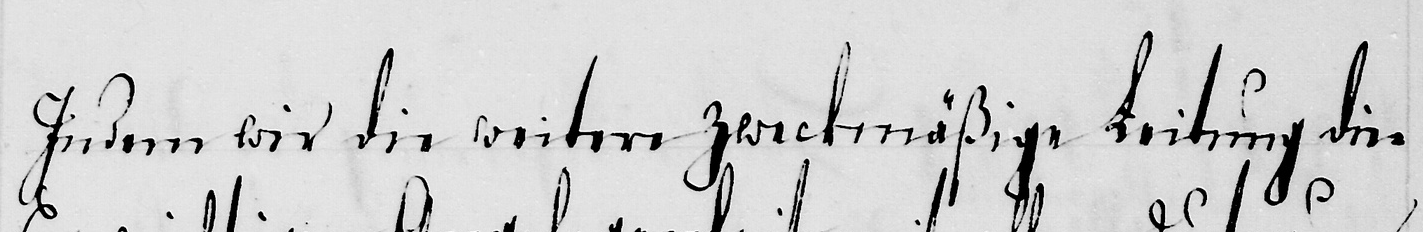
Indem wir die weitere zweckmäßige Leitung die¬
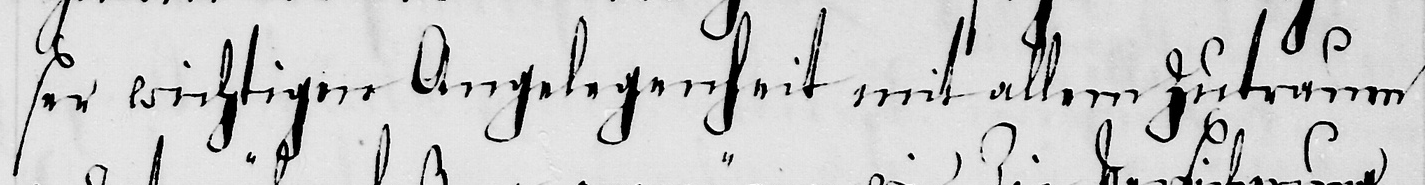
ser wichtigen Angelegenheiten mit allem Zutrauen
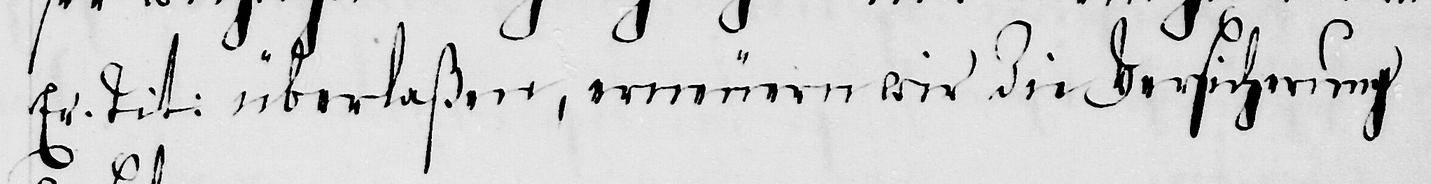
Er. Tit: überlaßen, erneuern wir die Versicherung
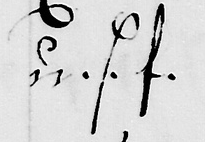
u. s. f.
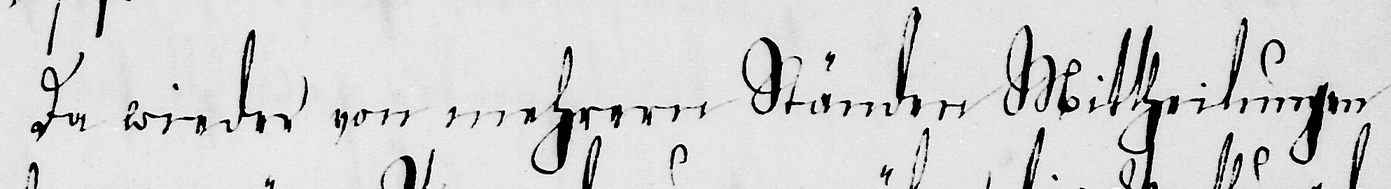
Da wieder von mehreren Ständen Mittheilungen
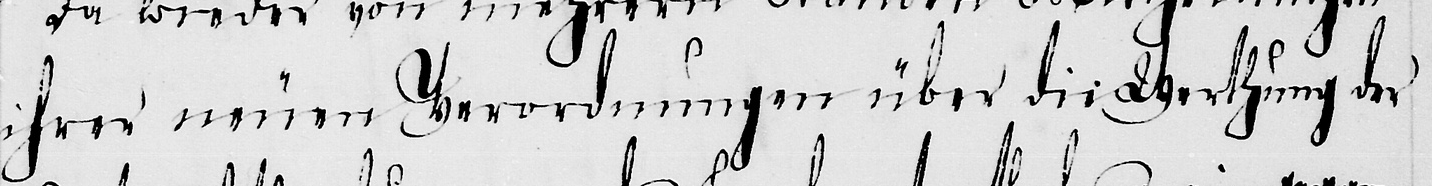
ihrer neuen Verordnungen über die Werthung der
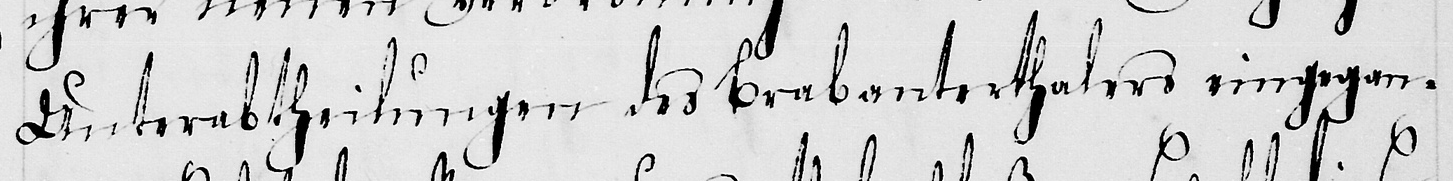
Unterabtheilungen des Brabanterthalers eingegan¬
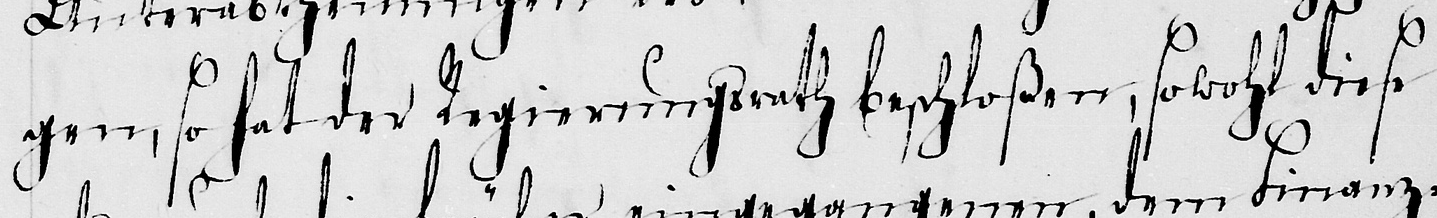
gen, so hat der Regierungsrath beschloßen, sowohl diese
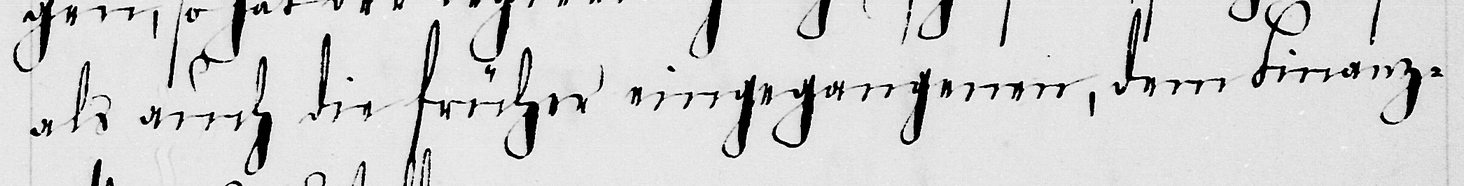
als auch die früher eingegangenen, dem Finanz¬
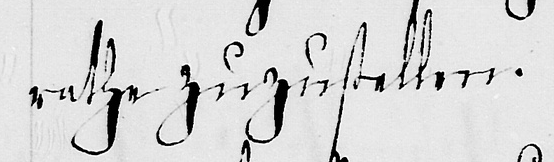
rathe zuzustellen.
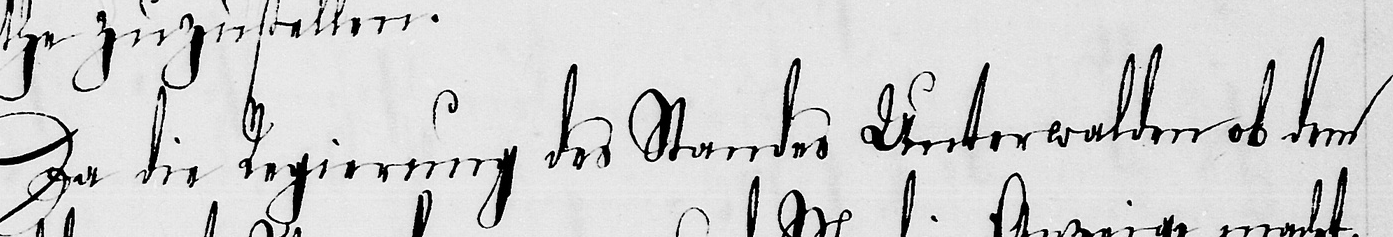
Da die Regierung des Standes Unterwalden ob dem
